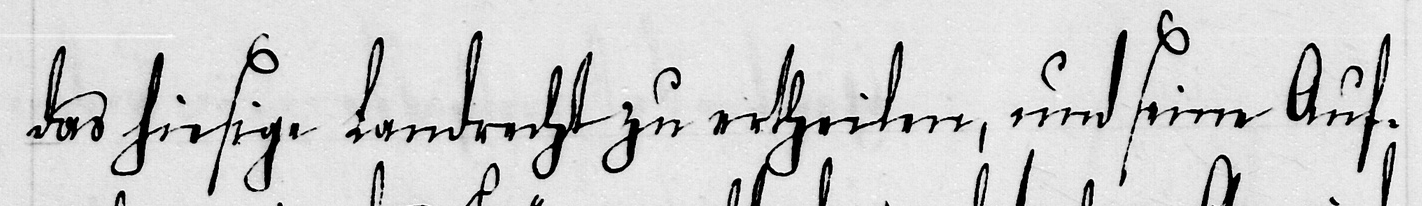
das hiesige Landrecht zu ertheilen, und seine Auf¬
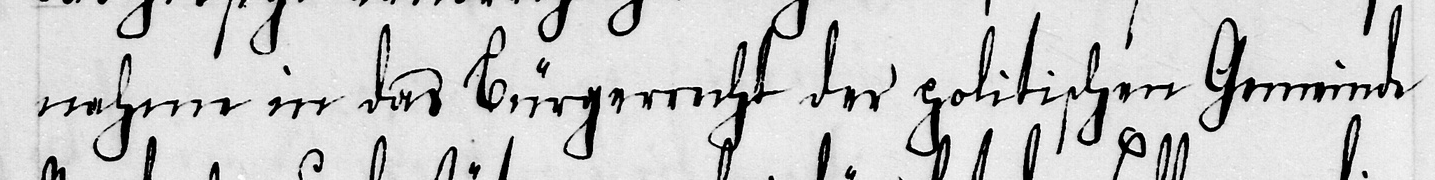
nahme in das Bürgerrecht der politischen Gemeinde
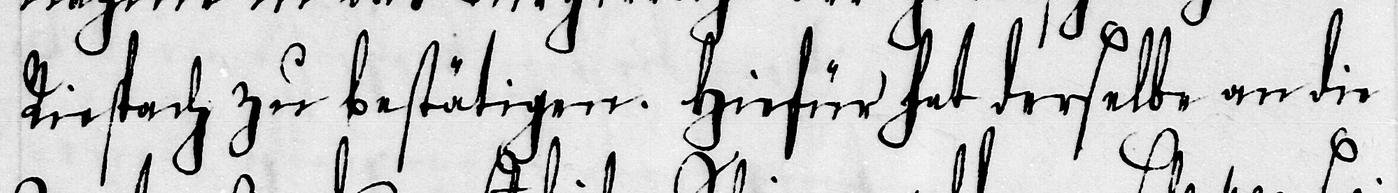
Riesbach zu bestätigen. Hiefür hat derselbe an die
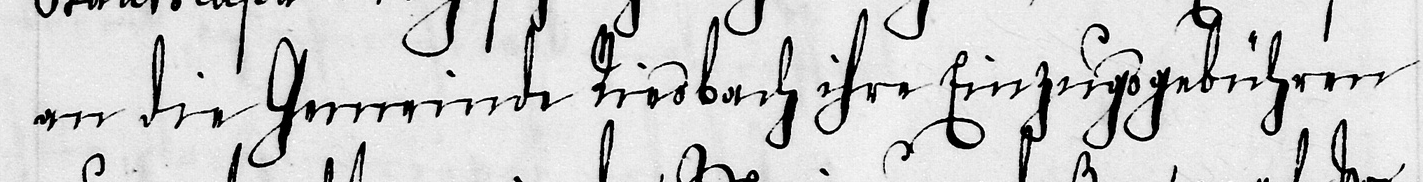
an die Gemeinde Riespach ihre Einzugsgebühren
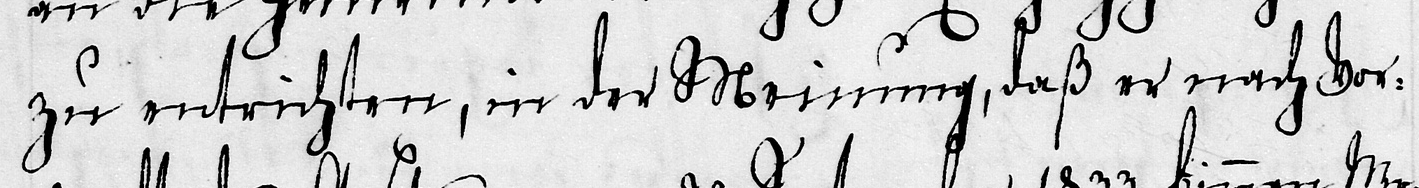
zu entrichten, in der Meinung, daß er nach Vor¬
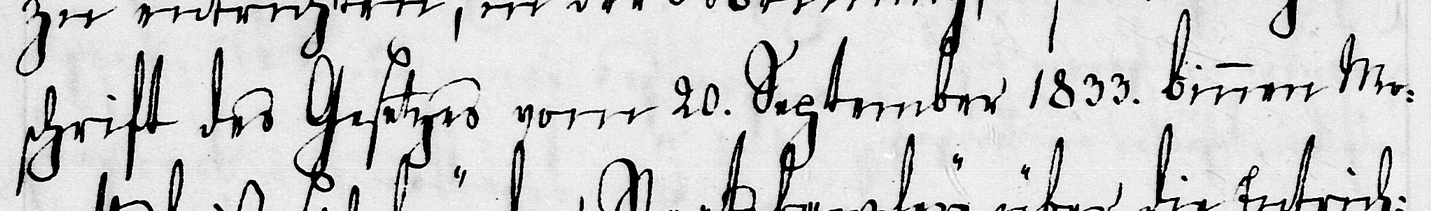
schrift des Gesetzes vom 20. September 1833. binnen Mo¬
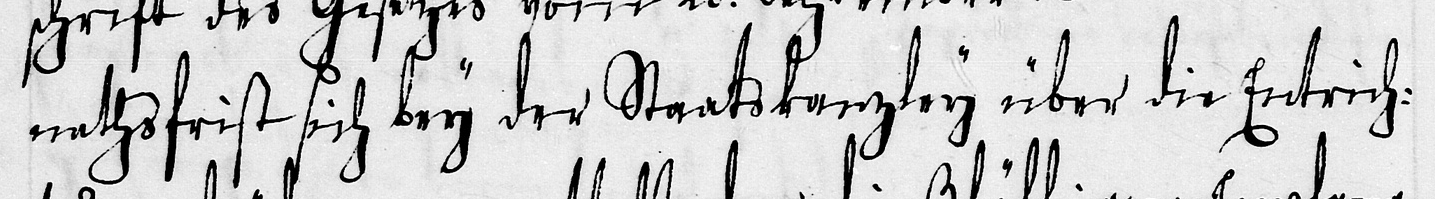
nathsfrist sich bey der Staatskanzley über die Entrich¬
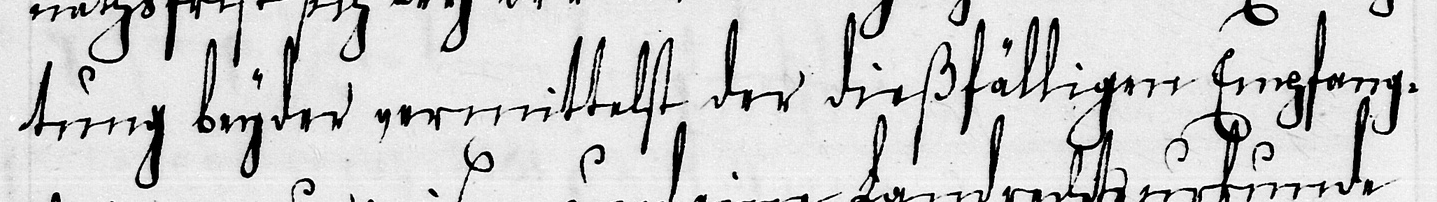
tung beyder vermittelst der dießfälligen Empfang¬
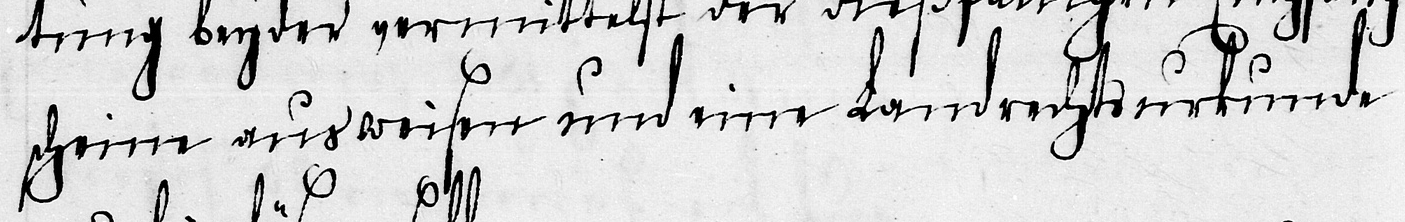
scheine ausweisen und eine Landrechtsurkunde
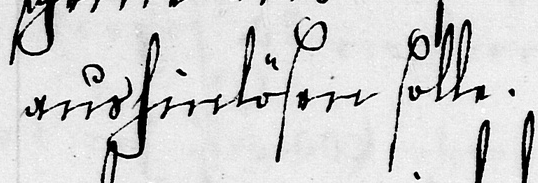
aushinlösen solle.
